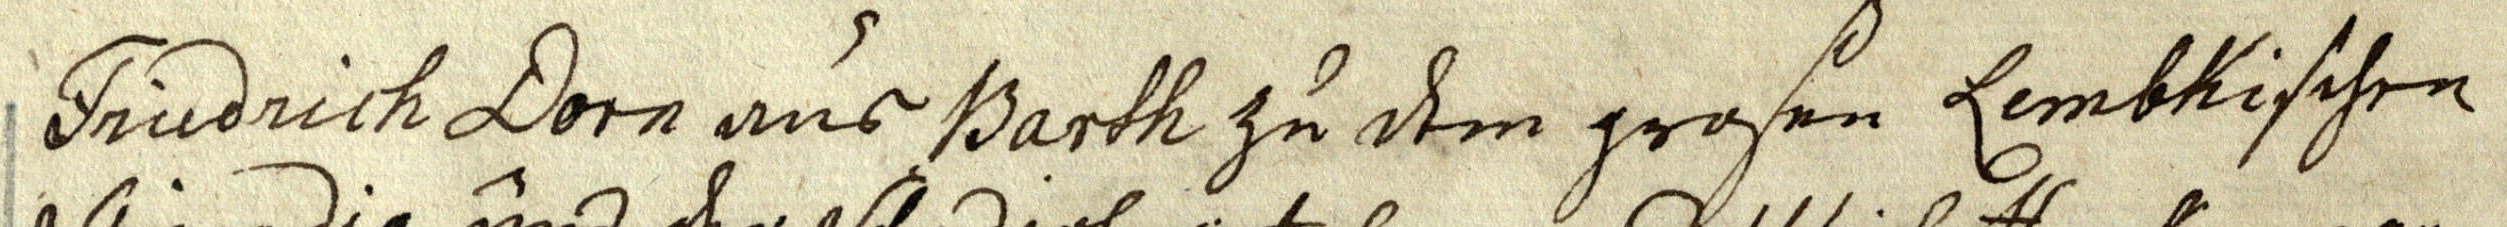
Friedrich Dorn aus Barth zu dem großen Lembkischen
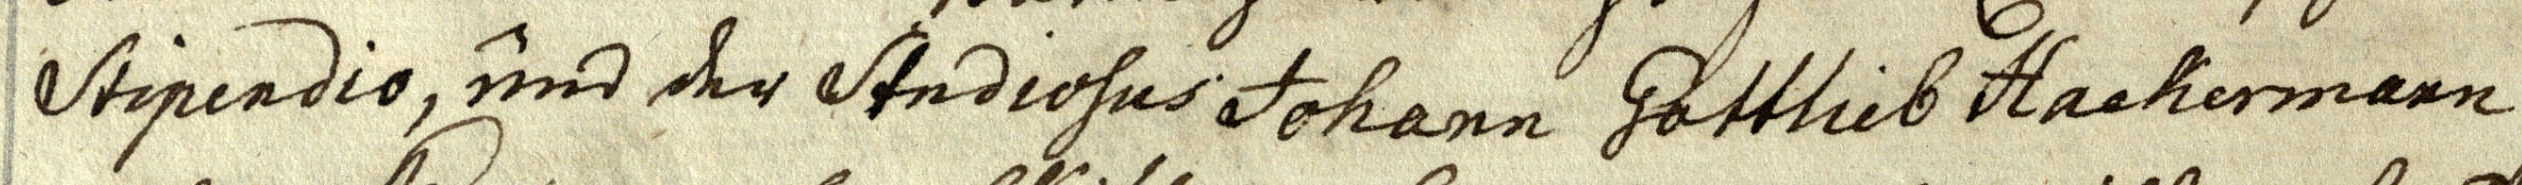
Stipendio, und der Studiosus Johann Gottlieb Haekermann
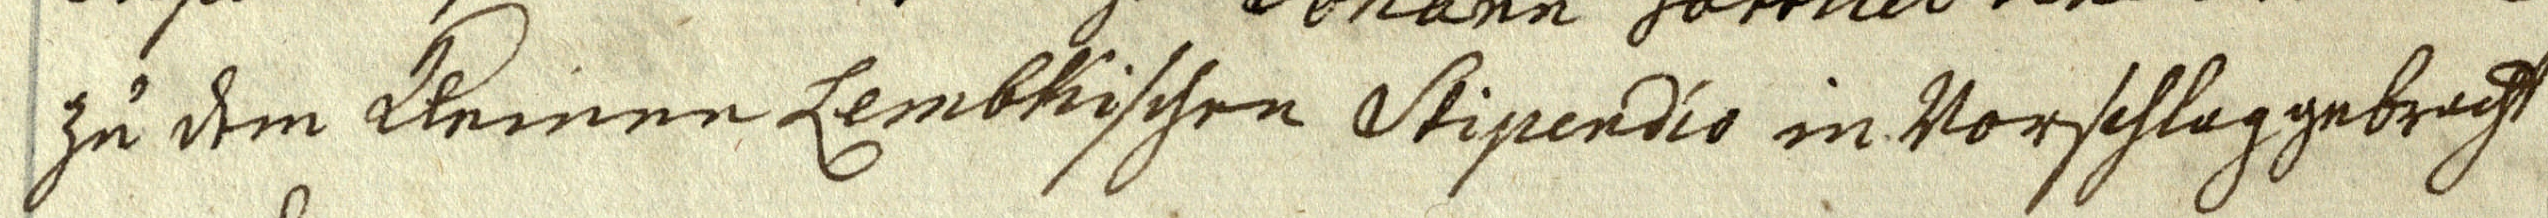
zu dem kleinen Lembkischen Stipendio in Vorschlag gebracht
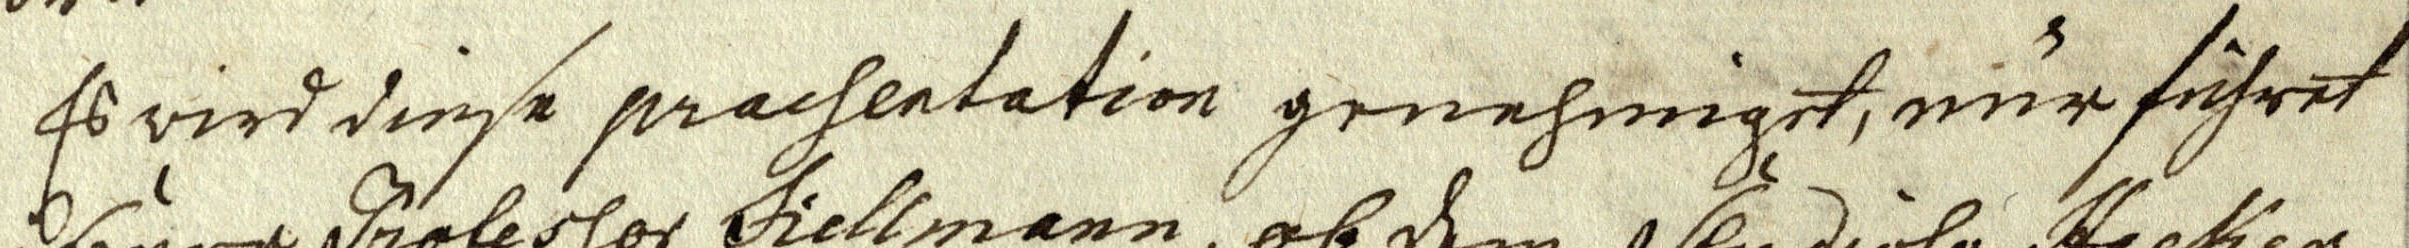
Es wird diese praesentation genehmiget, nurführet
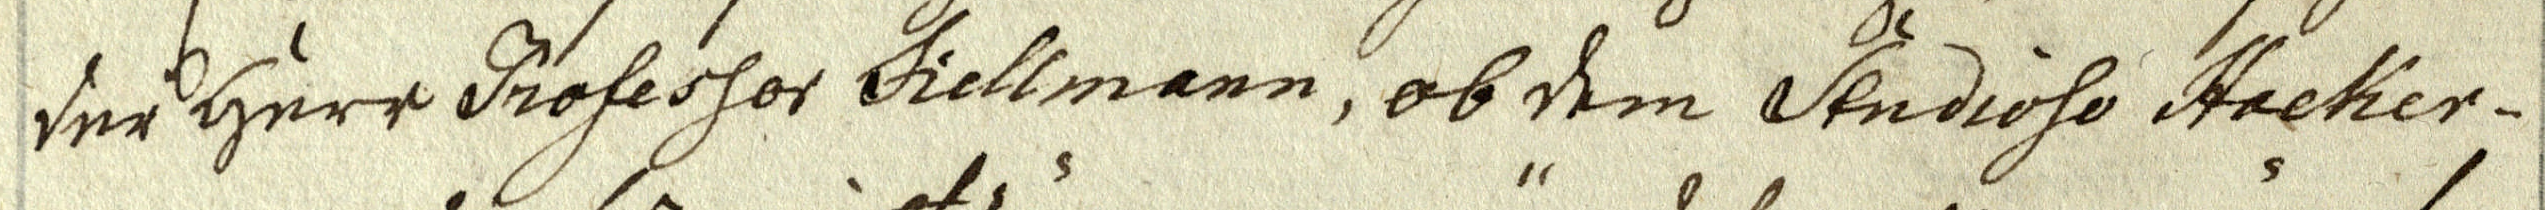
der Herr Professor Fielmann, ob dem Studioso Haeker¬
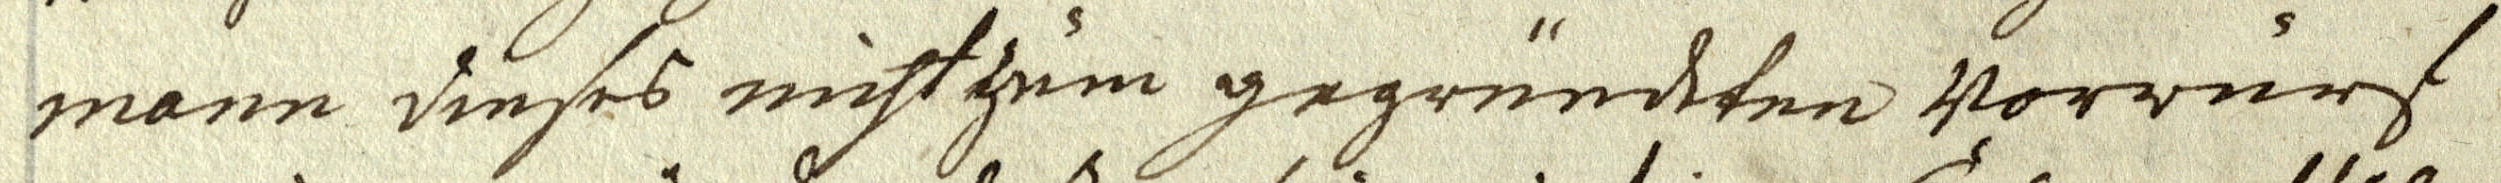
mann dieses nicht zum gegründeten Vorwurf
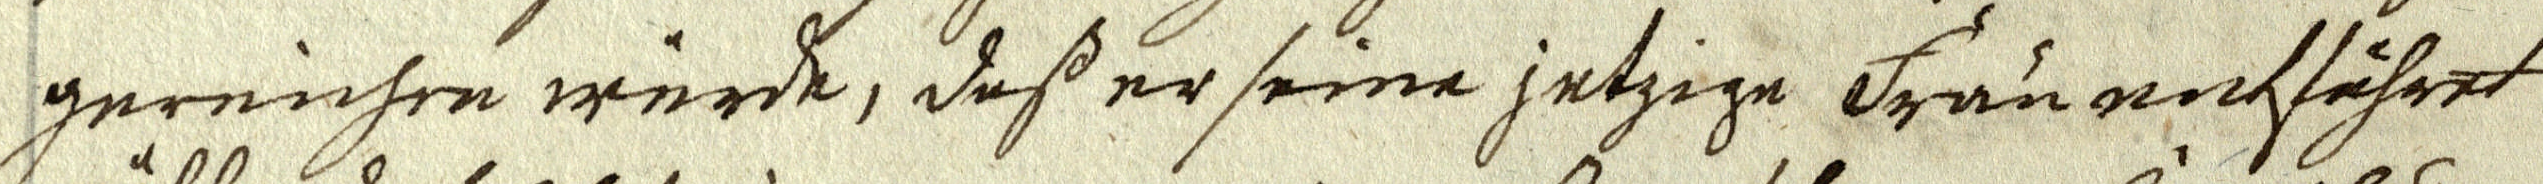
gereichen würde, daß er seine jetzige Frau entführet
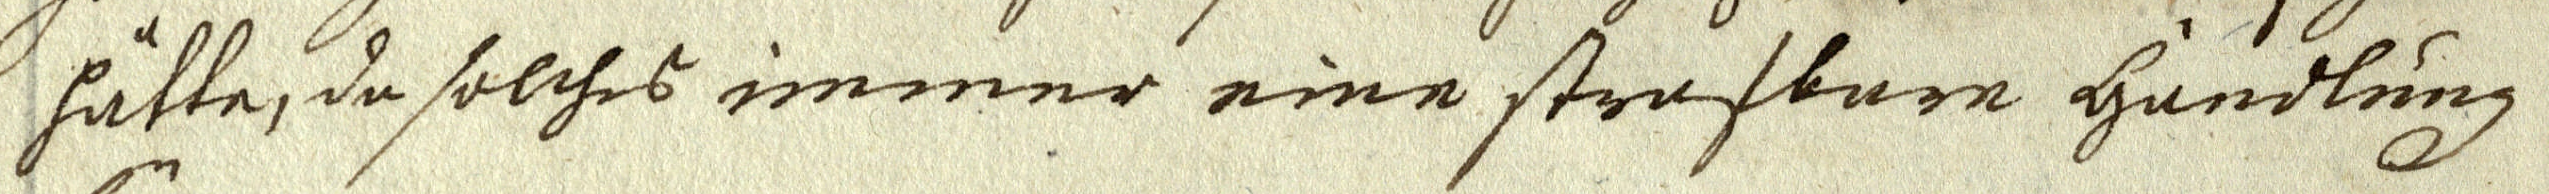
hätte, da solches immer eine strafbare Handlung
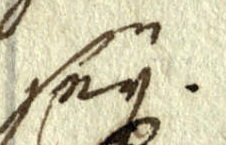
seÿ.
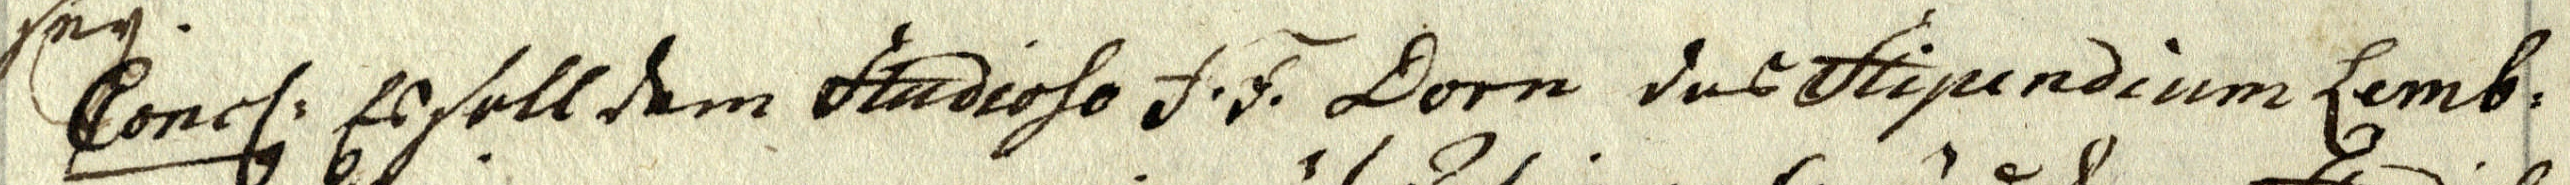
Concl. Es soll dem Studioso J.F. Dorn das Stipendium Lemb¬
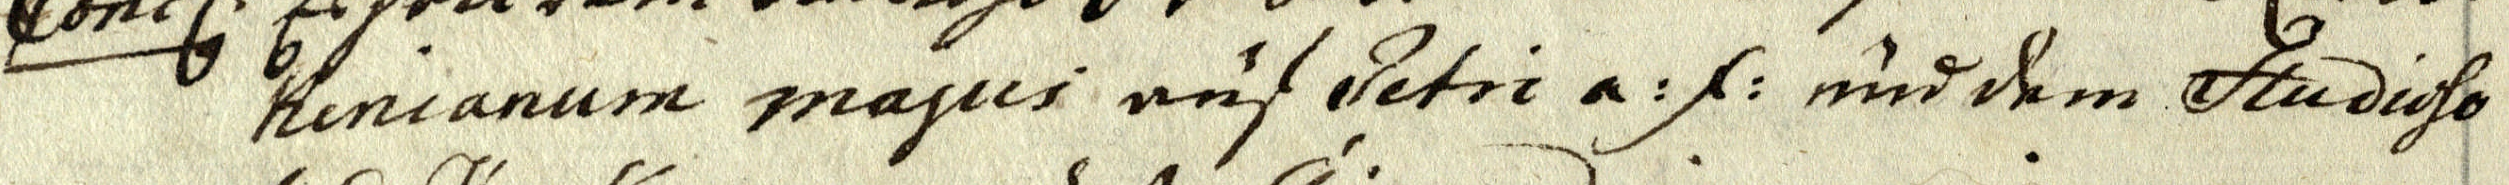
kenianum majus auf Petri a. f. und dem Studioso
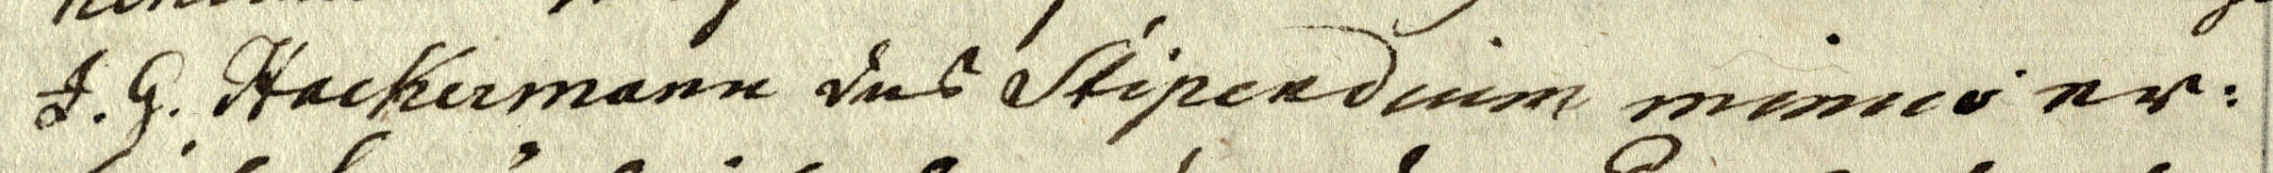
J. G. Haekermann das Stipendium minus er¬
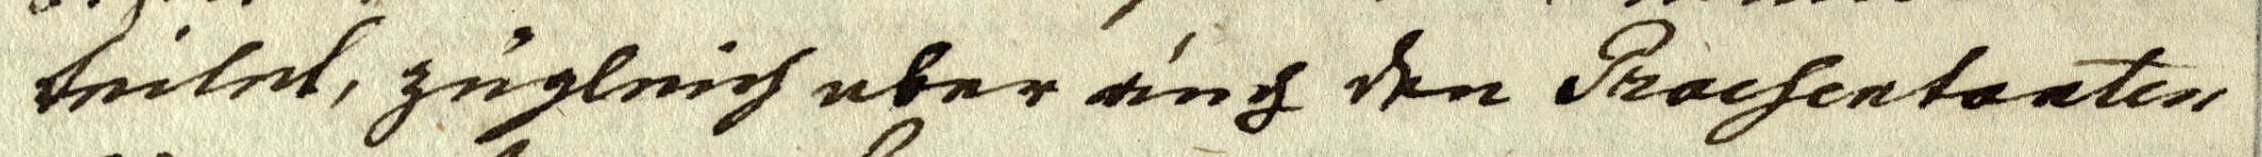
theilet, zugleich aber auch den Praesentanten
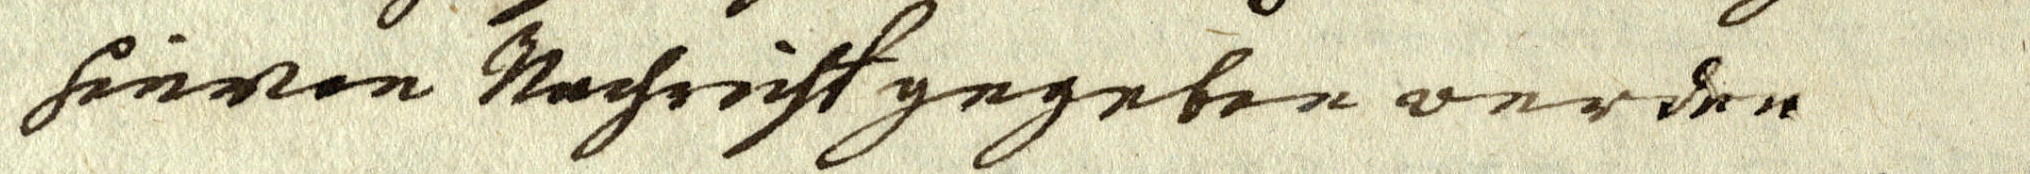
hievon Nachricht gegeben werden.
